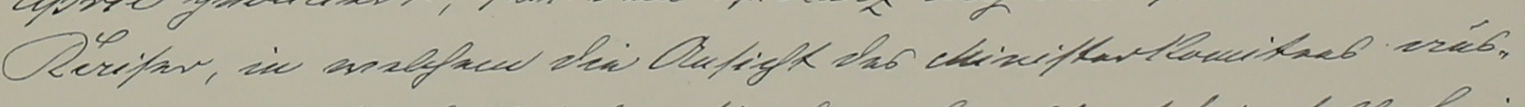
Kaiser, in welchem die Ansicht des Ministerkomitees aus-
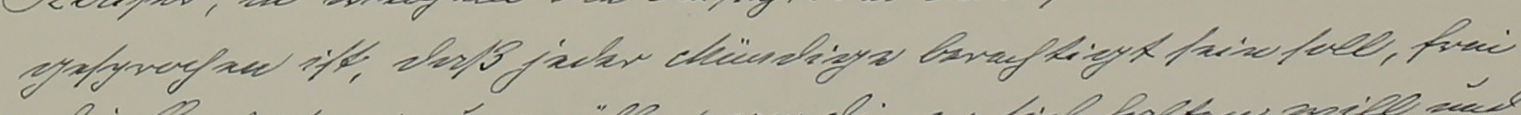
gesprochen ist, daß jeder Mündige berechtigt sein soll, frei
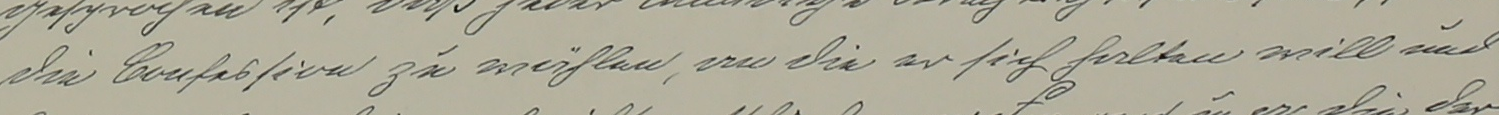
die Confession zu wählen, an die er sich halten will und
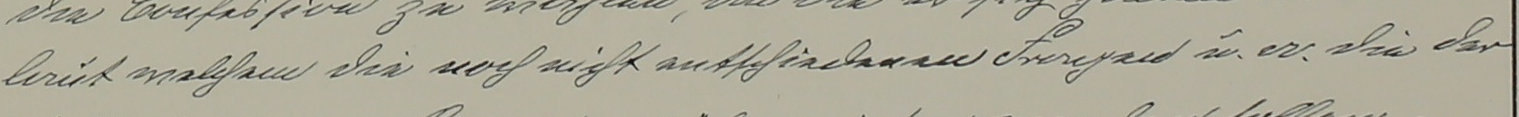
laut welchem die noch nicht entschiedenen Fragen u.a. die der
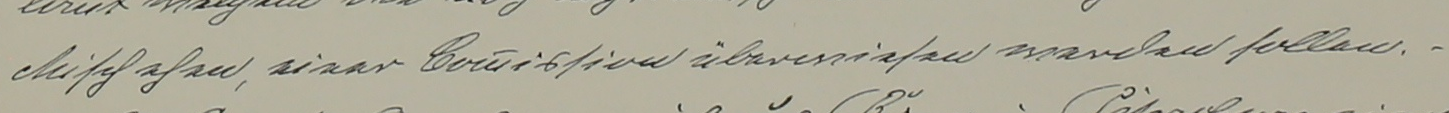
Mischehen, einer Commission überwiesen werden sollen.
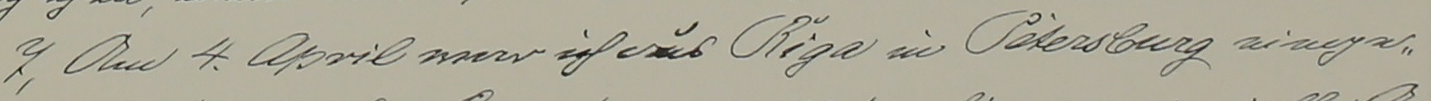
7. Am 4. April war ich aus Riga in Petersburg einge-
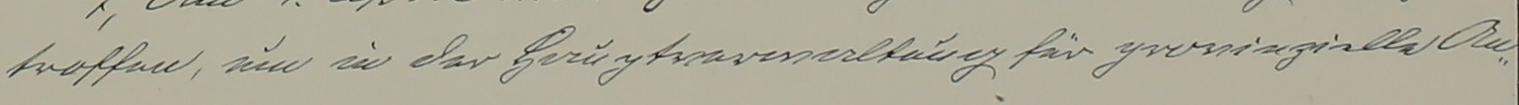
troffen, um in der Hauptverwaltung für provinzielle An-
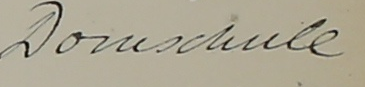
Dmoschule
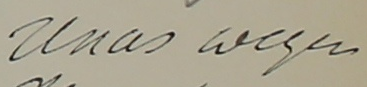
Ukas wegen
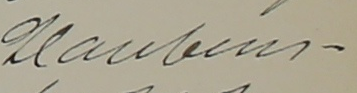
Glaubens-
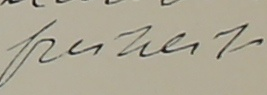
freiheit
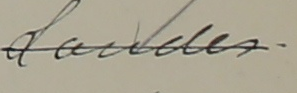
Landes
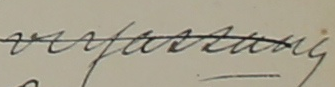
verfassung
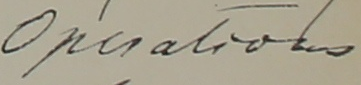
Operations
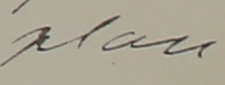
plan
